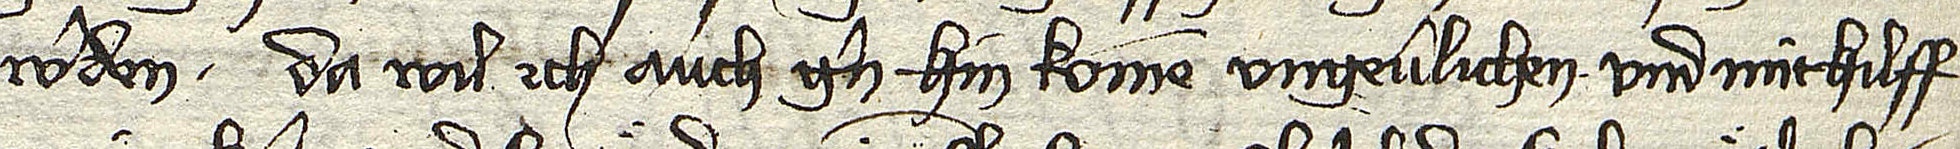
w*den / da wil ich auch g*n hin kome* vngeu*lichen . vnd mit hilff
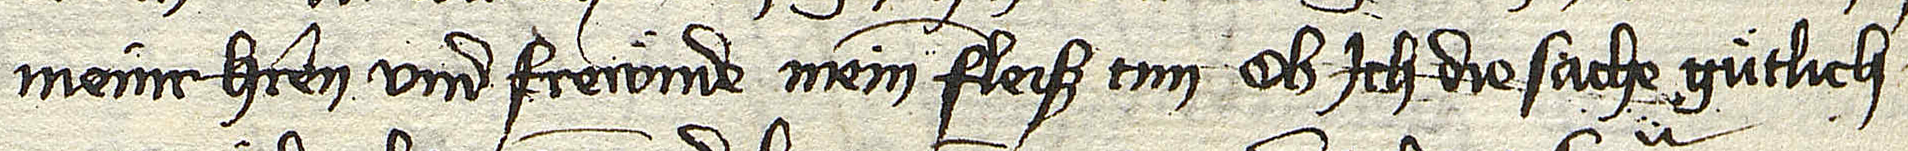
meinr h*ren vnd frewnde mein* fleiſʒ tun Ob Ich die ſache gütlich -
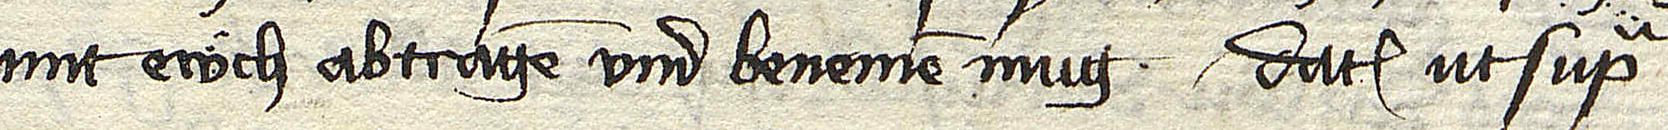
mit ewch abtrage* vnd beneme* mug . / Dat* ut ſup*
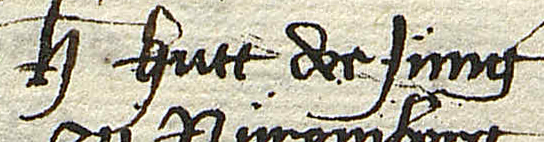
H* hutt der Iüng*
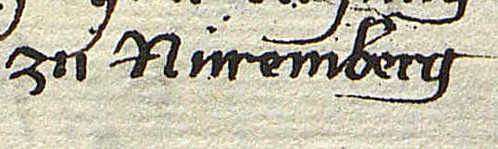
ʒu Nüremberg
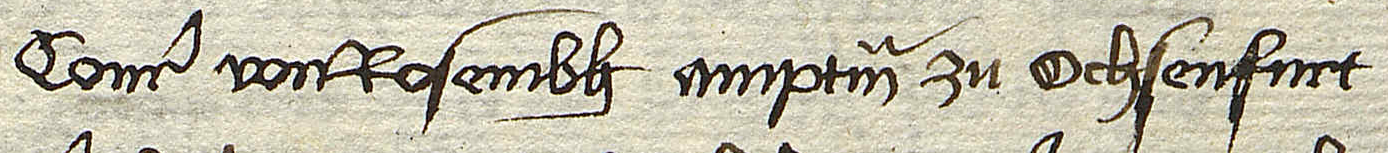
Conr* von Roſemb*g amptm* ʒu Ochſenfurt
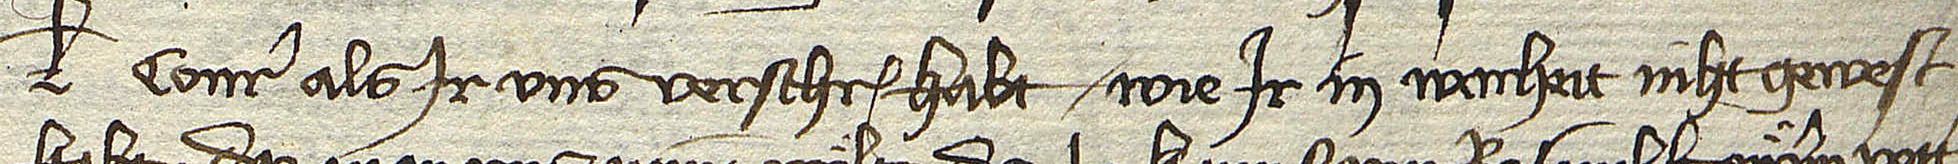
L* Conr* als Ir vns verſchr* habt / wie Ir in warheit niht geweſt
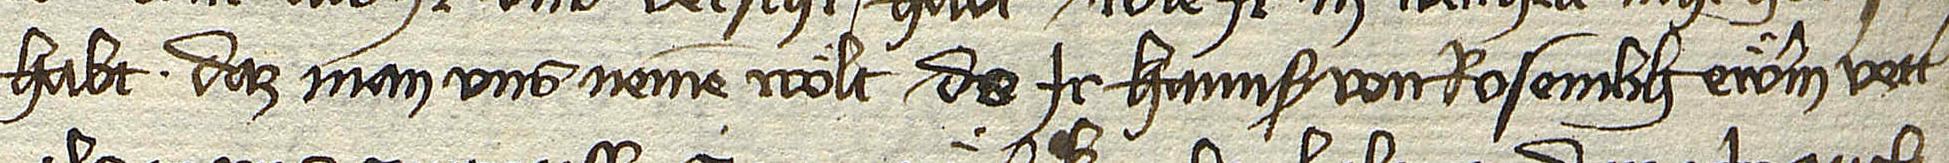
habt . daʒ man vns neme* wölt / die Ir hannſ* von Roſemb*g ew*m vett*
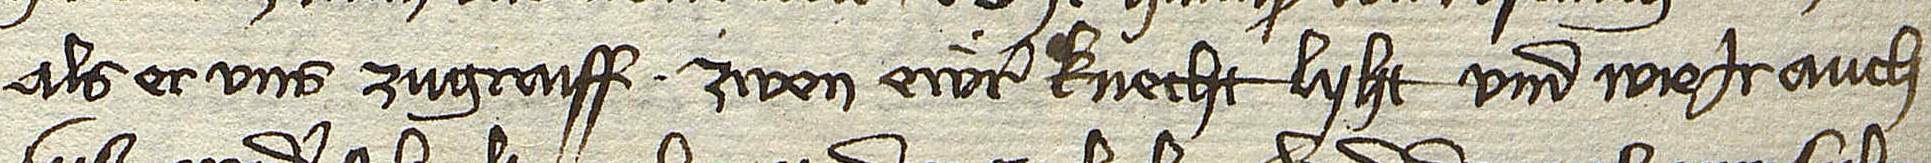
als er vns ʒugraiff . ʒwen ew*r knecht lyht vnd wie Ir auch
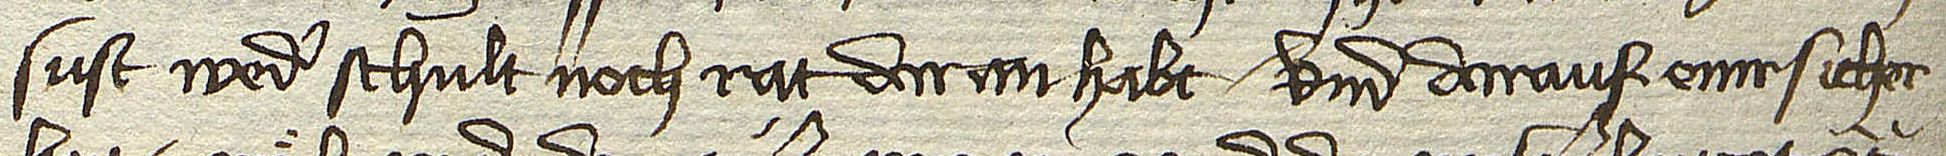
ſuſt wed* ſchult noch rat daran habt / Vnd darauf einr ſicher
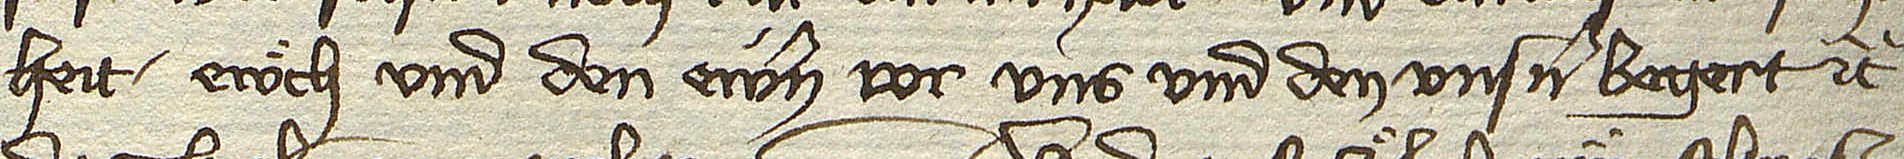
heit / ewch vnd den ew*n vor vns vnd den vnſ*n begert ec*
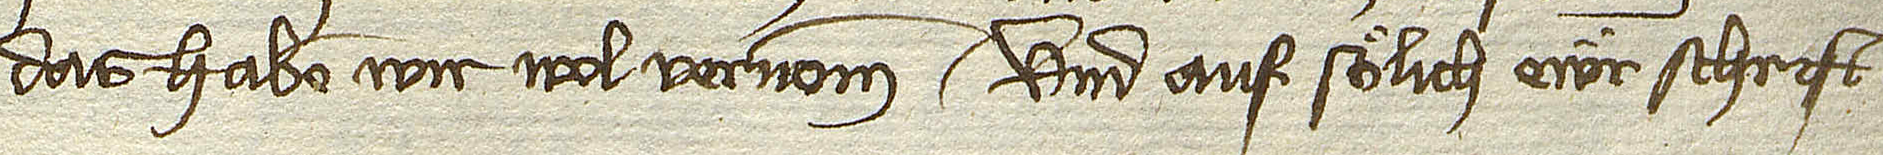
das habe* wir wol vernom* / Vnd auf ſölich ewr ſchrift
